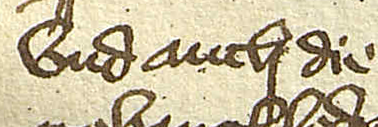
vnd auch die
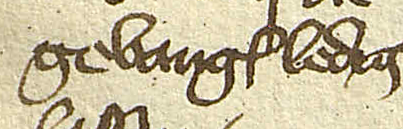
gevang* ledig
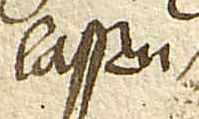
laſſen /
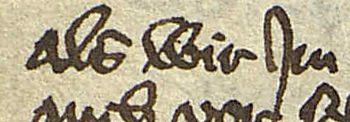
als wir Im
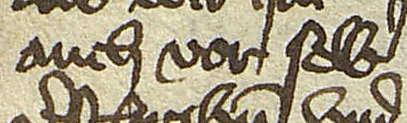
auch vor ſelb*
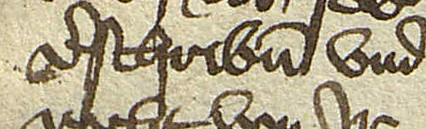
v*ſchribn* vnd
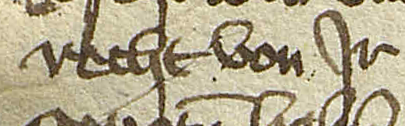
recht von Ir
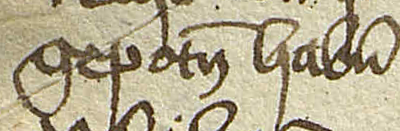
gepotn* habn*
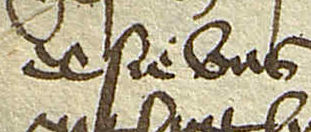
ee ſie vns
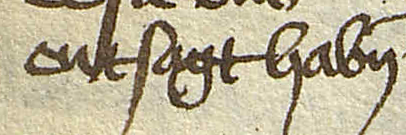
entſagt habn*
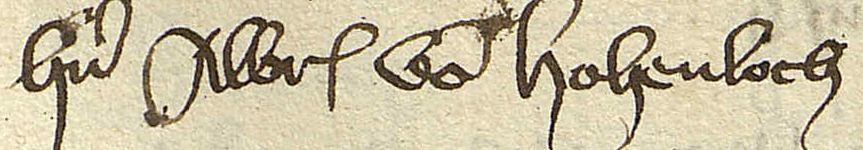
hn* Albr* vo* hohenloch
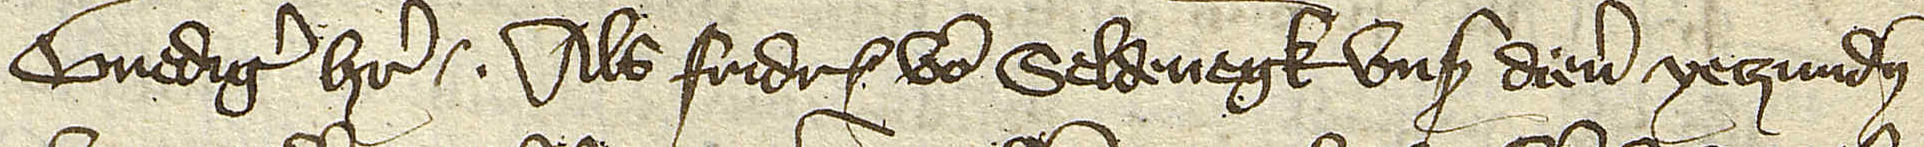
Gnedig* hr* / . Als Fridr* vo* Seldenegk vnſ* dien* yecʒund*n
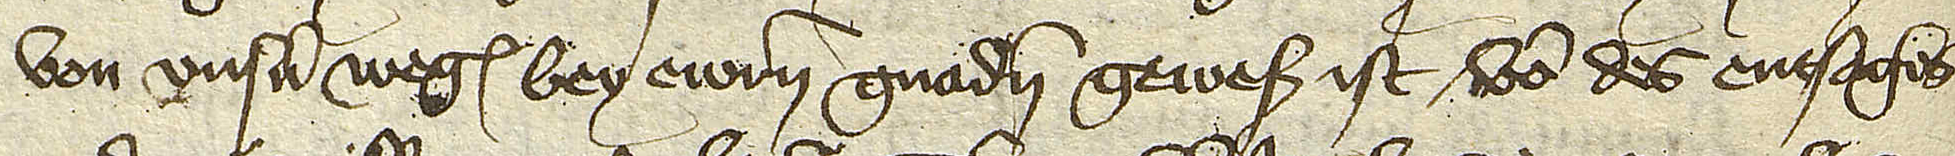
von vnſn* weg* bey ewr*n gnadn* geweſ* iſt / vo* des entſages*
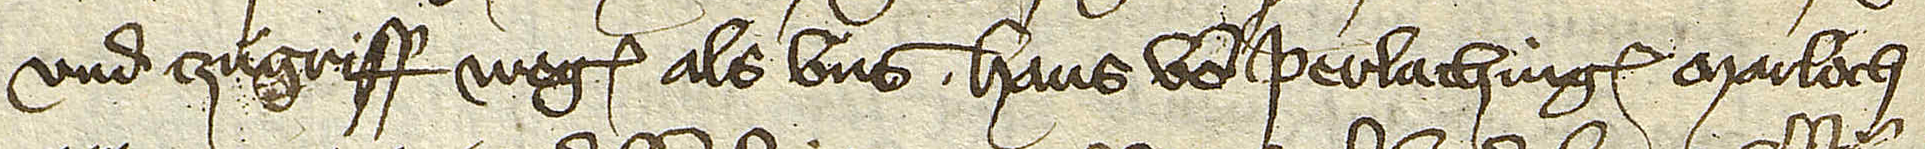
vnd cʒügriff weg* als vns hans vo* Perlaching* Marloch
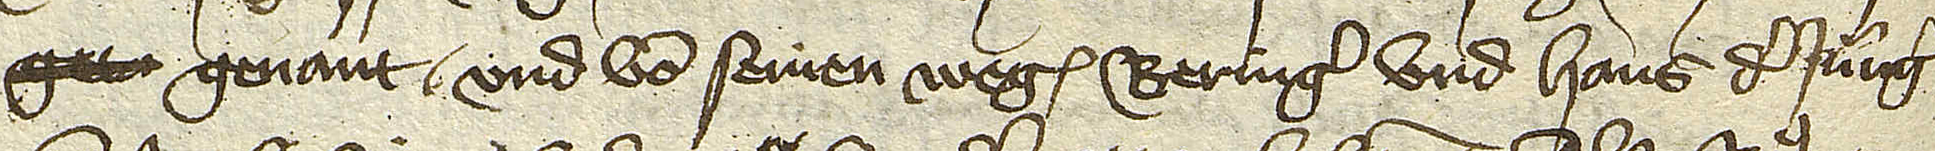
geta genant / vnd vo* ſeinen weg* Bering* vnd hans d* Iüng*
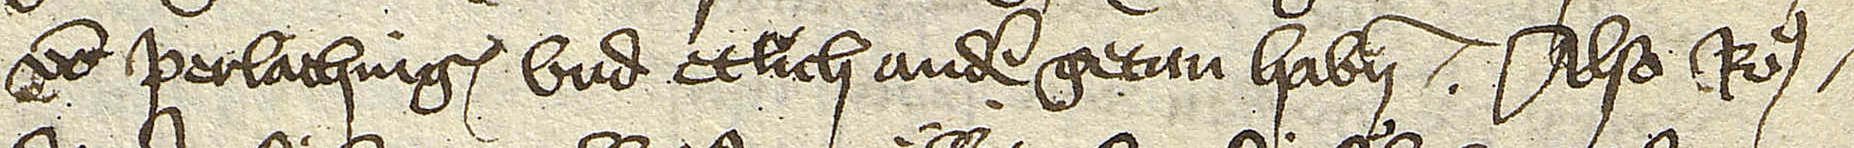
vo* Perlaching* vnd etlich ande* getan habn* / . Alſo Ro* /
